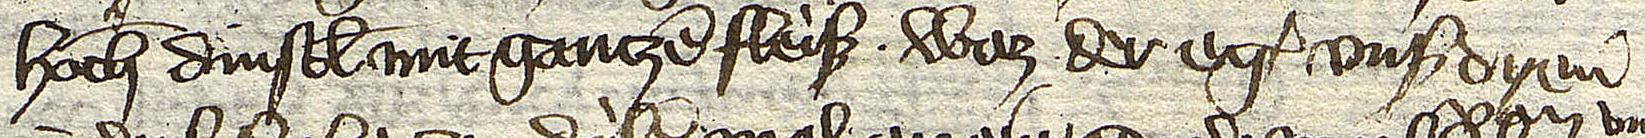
hoch* dinſtl* mit gancʒe* fleiſʒ . waʒ der eg* vnſ* dyen*
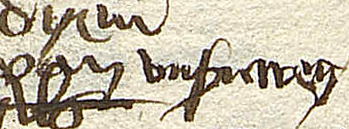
von vnſ*n weg*
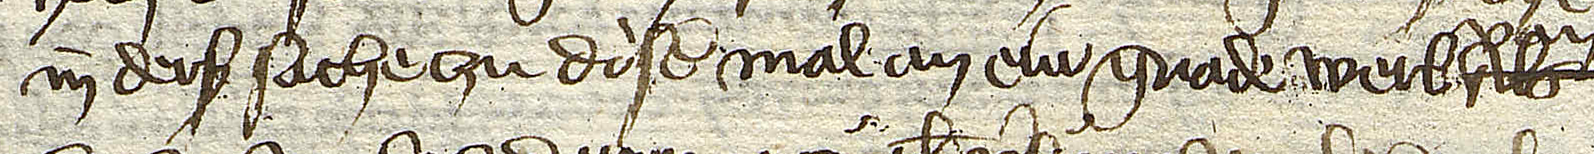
in derſ* ſache cʒu diſe* mal an ewr gnade werb Als
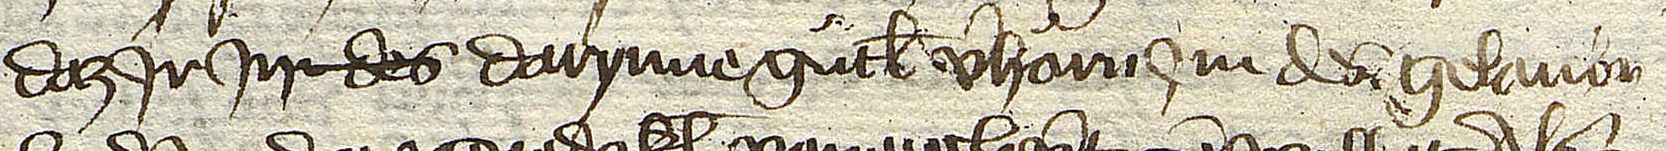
daʒ Ir In des darynne gütl* v*hörn Im des gelaub*n
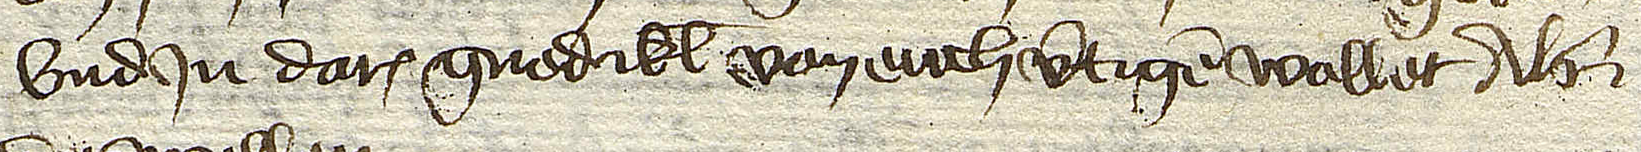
vnd In dar* gnedikl* von ewch v*tige* wollet Als ec*
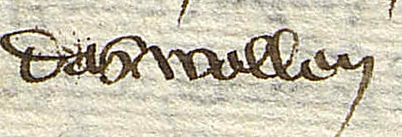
das wollen
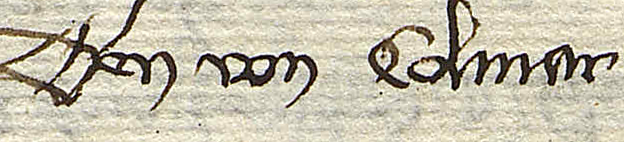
Den von Colmar
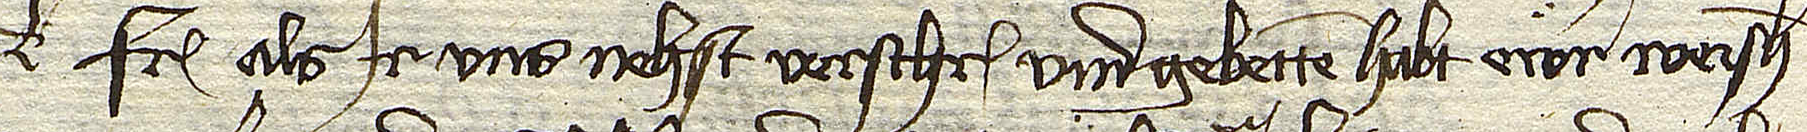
L* fr* als Ir vns nehſt verſchr* vnd gebette* habt ew*r weiſh*
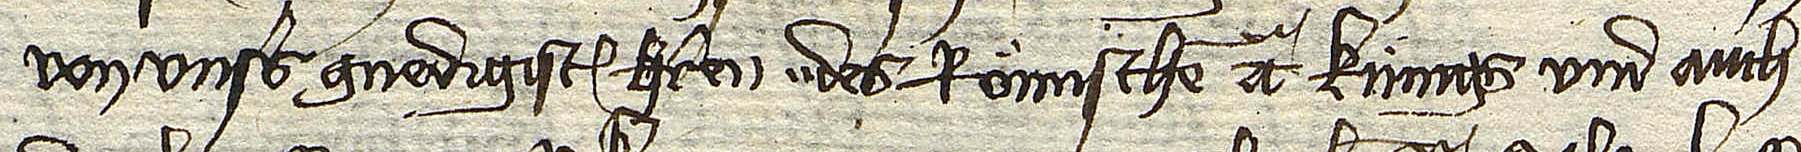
von vnſ*s gnedigiſt* h*ren ~ des Römiſche* ec* künigs vnd auch
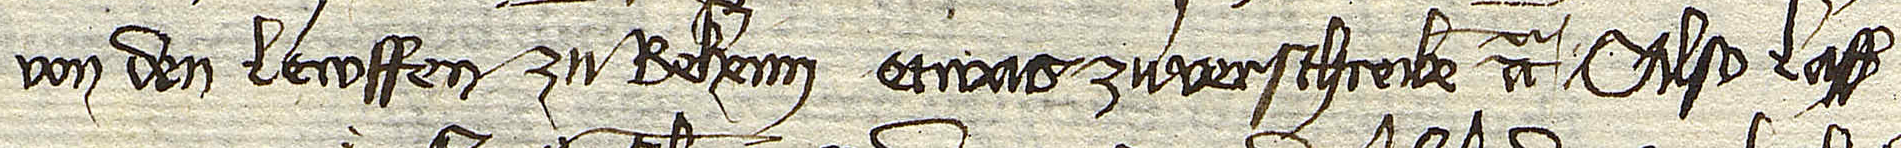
von den lewffen ʒu Beheim etwas ʒu verſchreibe* ec* Alſo laſſ*
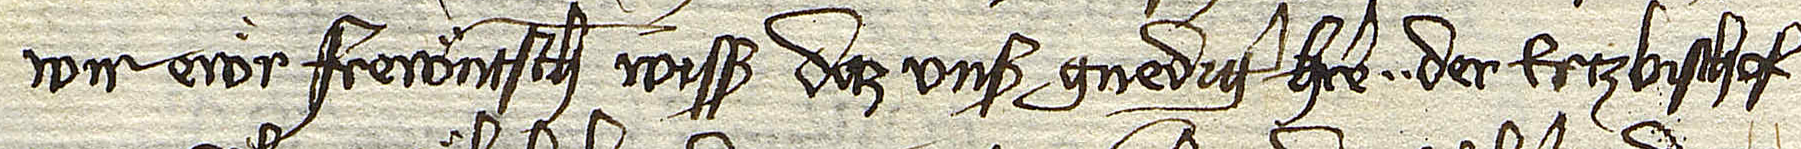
wir ewr frewntſch* wiſſ* daʒ vnſ* gnedig* h*re ~ der Ercʒbiſchof
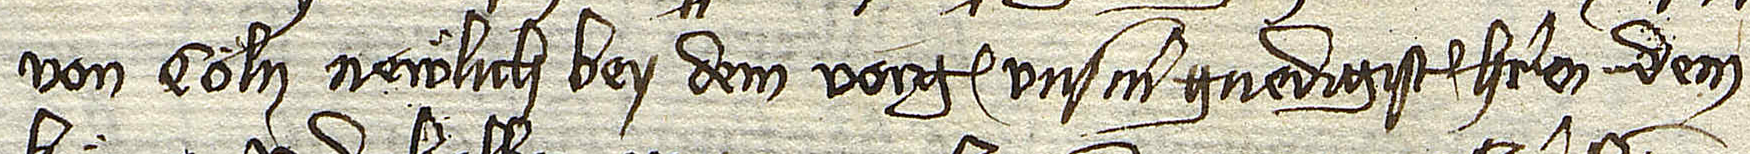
von Cöln newlich bey dem vorg* vnſ*m gnedigiſt* h*ren ~ dem
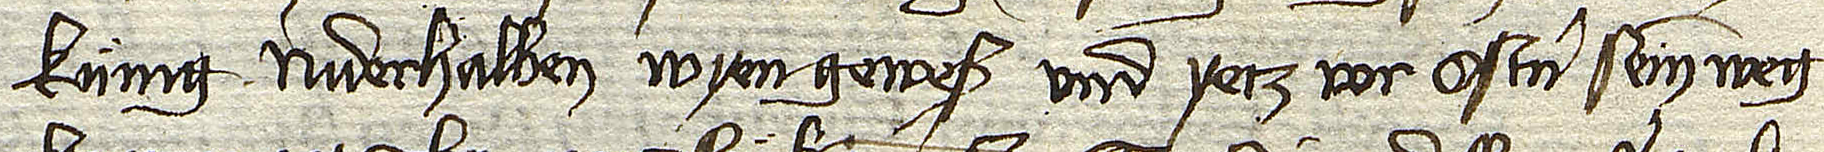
künig . Niderhalben wyen geweſ* vnd yecʒ vor Oſt*n ſein* weg
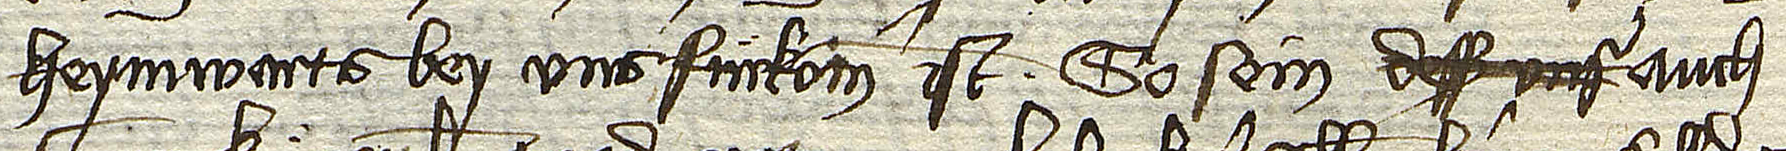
heymwarts bey vns fürkom* iſt . So ſein deſſ* vnſ* auch
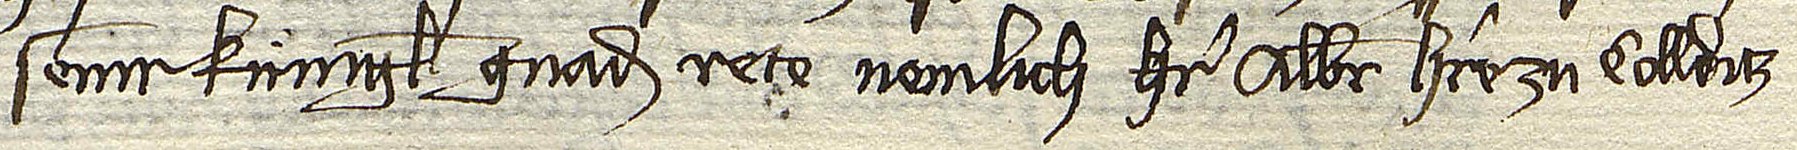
ſeinr künigl* gnad* rete nemlich h*r Albr* h*re ʒu Colldicʒ
